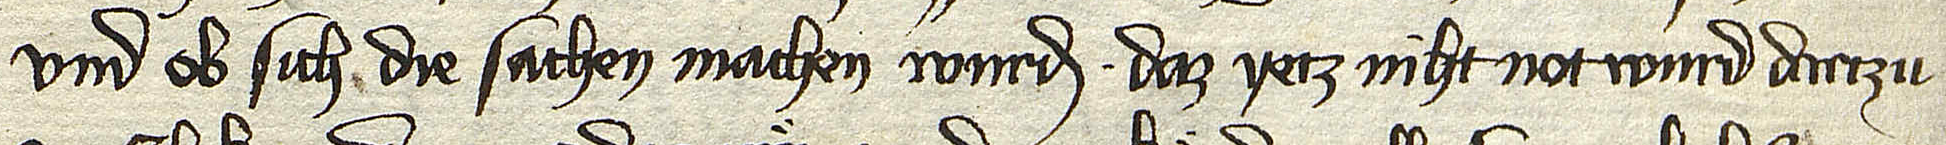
vnd ob ſich die ſachen machen wurd* . daʒ yecʒ niht not wurd darcʒu
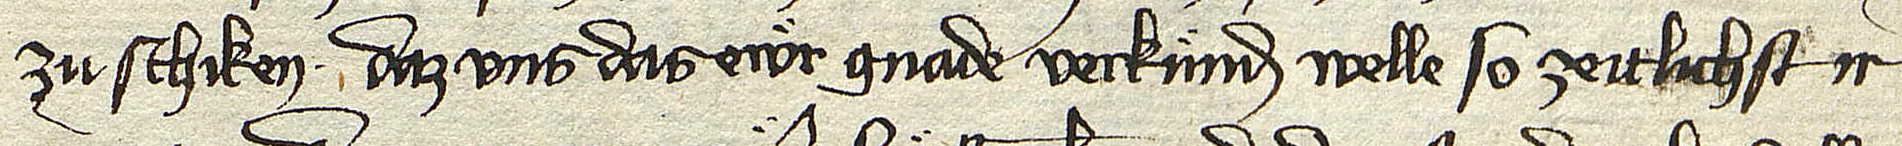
ʒu ſchiken . daʒ vns das ewr gnade verkünd* welle ſo ʒeitlichſt ir
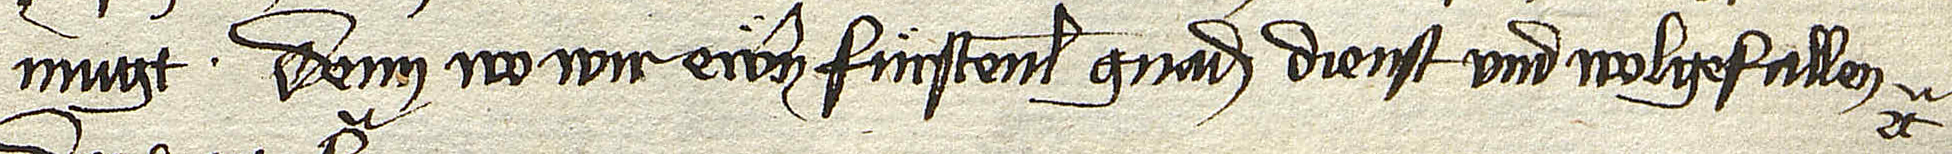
mugt . Denn wo wir ew*n fürſtenl* gnad* dienſt vnd wolgefallen
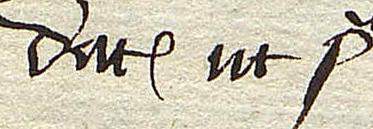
Dat* ut ſ*
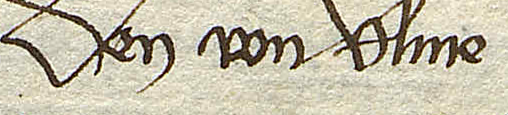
Den von Vlme
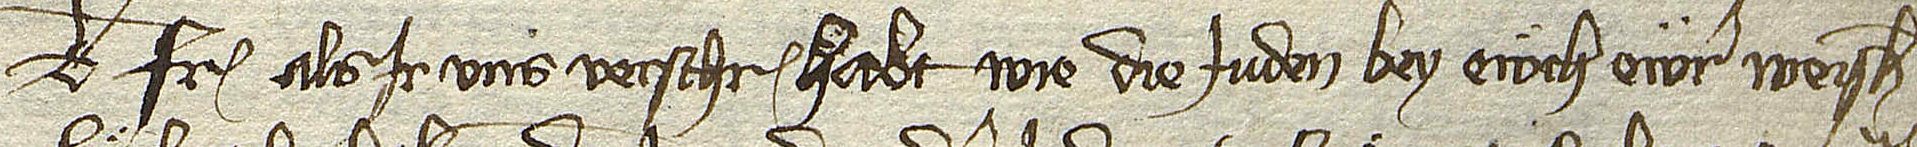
L* fr* als Ir vns verſchr* habt wie die Iuden bey ewch ew*r weiſh*
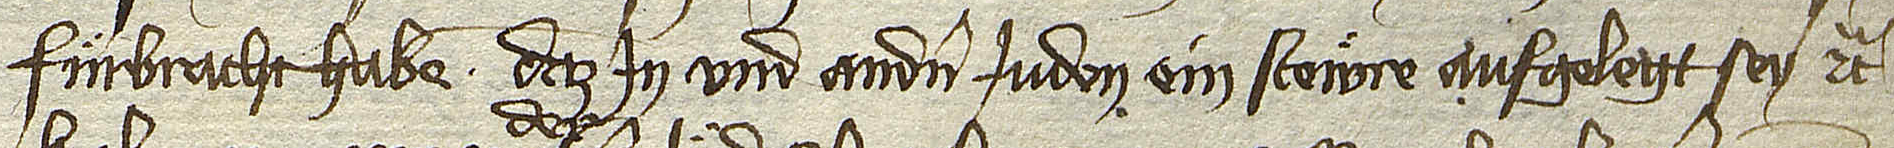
fürbracht habe* . daʒ In vnd and*n Iuden ein ſtewre aufgelegt ſey ec*
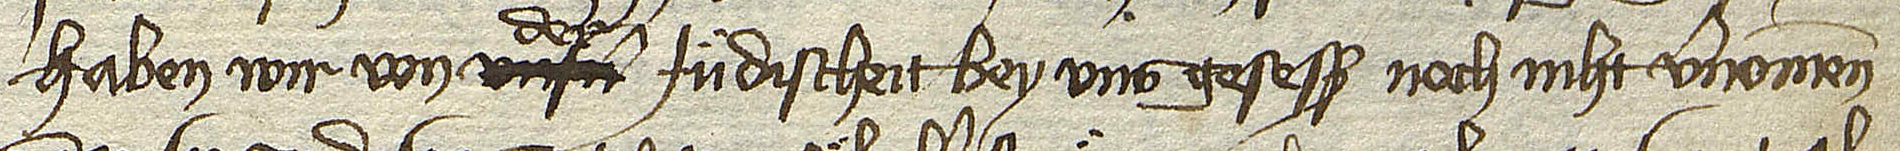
haben wir von vnſ*n Iüdiſcheit bey vns geſeſſ* noch niht v*nomen*
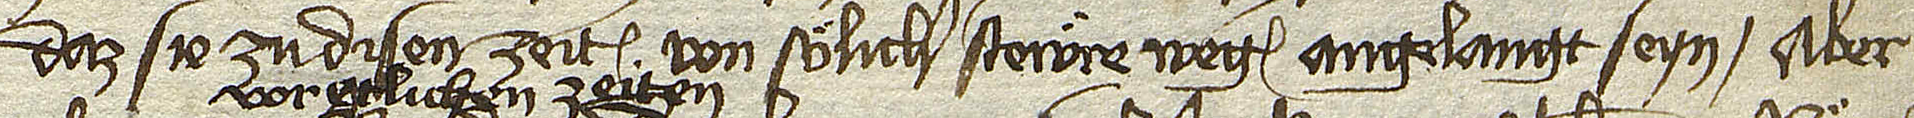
daʒ ſie ʒu diſen ʒeit* . von ſölich* ſtewre weg* angelangt ſeyn / Aber
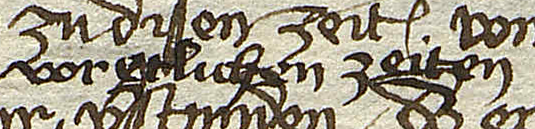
vor etlichen ʒeiten
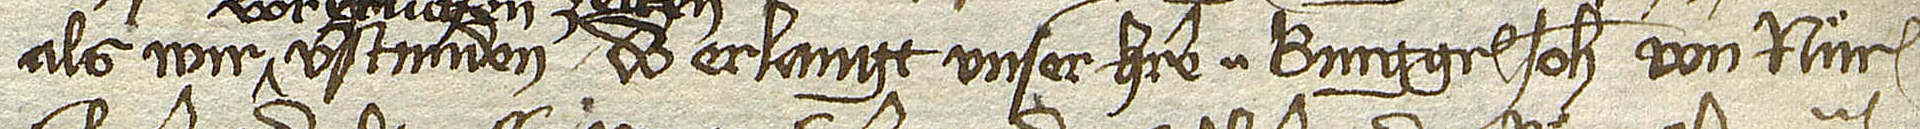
als wir v*ſtunden / Do erlangt vnſer h*re ~ Burggr* Ioh* von Nür*
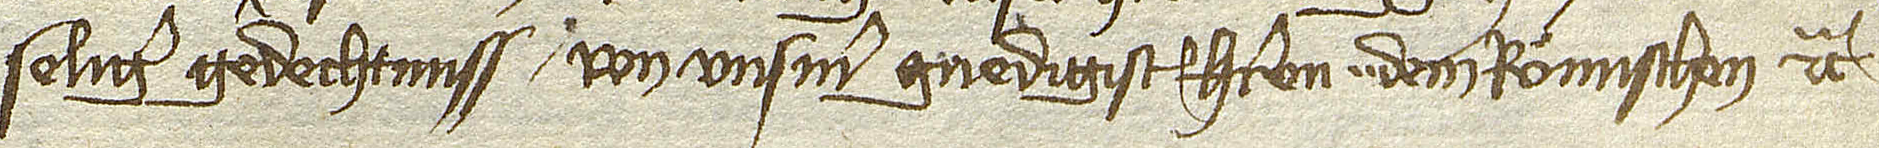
ſelig* gedechtnuſſ / von vnſ*m gnedigiſt* h*ren ~ dem Römiſchen ec*
